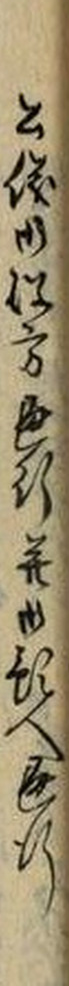公儀御役方通行幷御預人通行
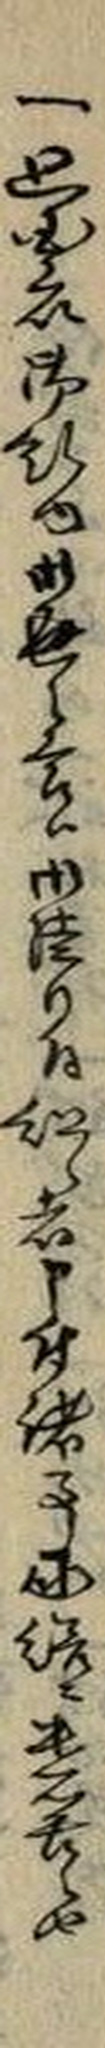一廻国衆御領内御通之節ハ御徒目付組之者申付諸事承繕ニ遣筈候由
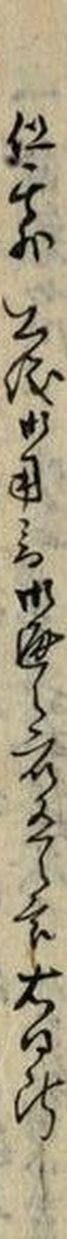但其外公儀御用ニ而御通之衆有之節右同断
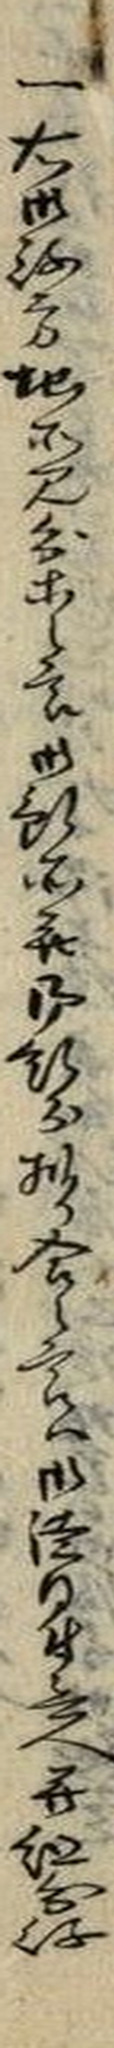一右御役方地所見分等之節御預所幷御領分掛り合之節ハ御徒目付壱人幷組分役
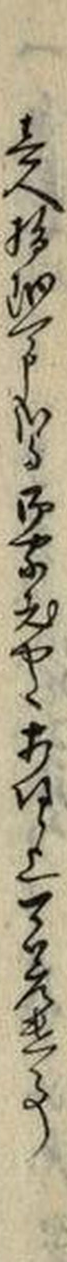壱人指越可申哉与御家老中へ相伺候上可差遣事
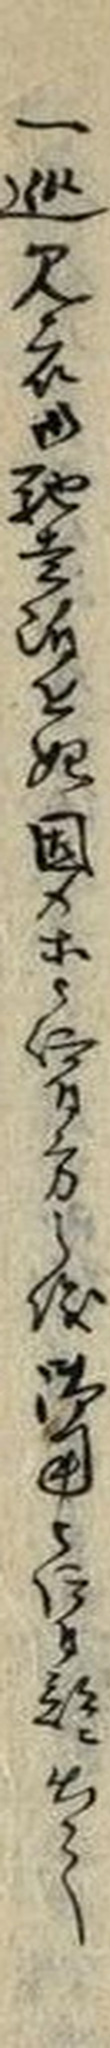一巡見衆御馳走附を始固メ等被仰付方之儀御用被仰付部ニ出之
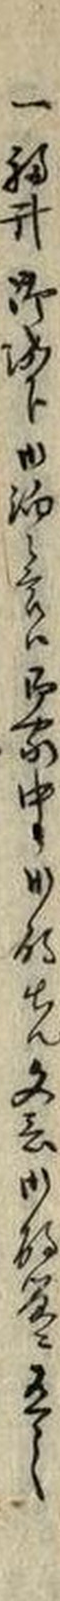一福井御城下御泊之節ハ御家中御触出ル文言御触留ニ有之
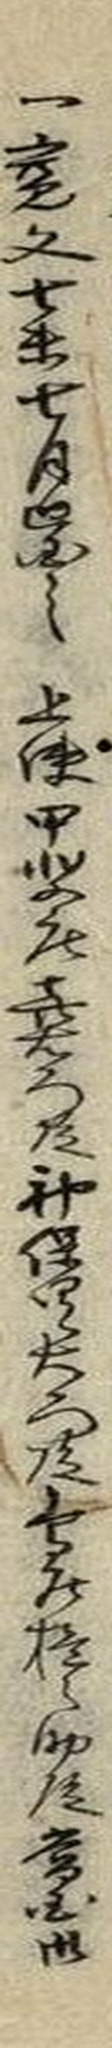一寛文七未七月廻国之上使甲斐庄喜右衛門殿神保四郎右衛門殿鳥居権之助殿当国御
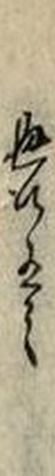通行有之
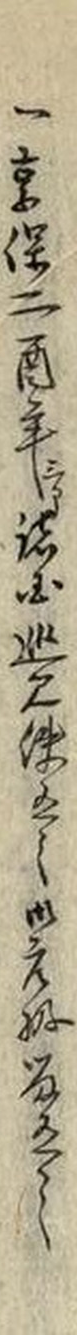一享保二酉年三月諸国巡見使有之御取扱留有之
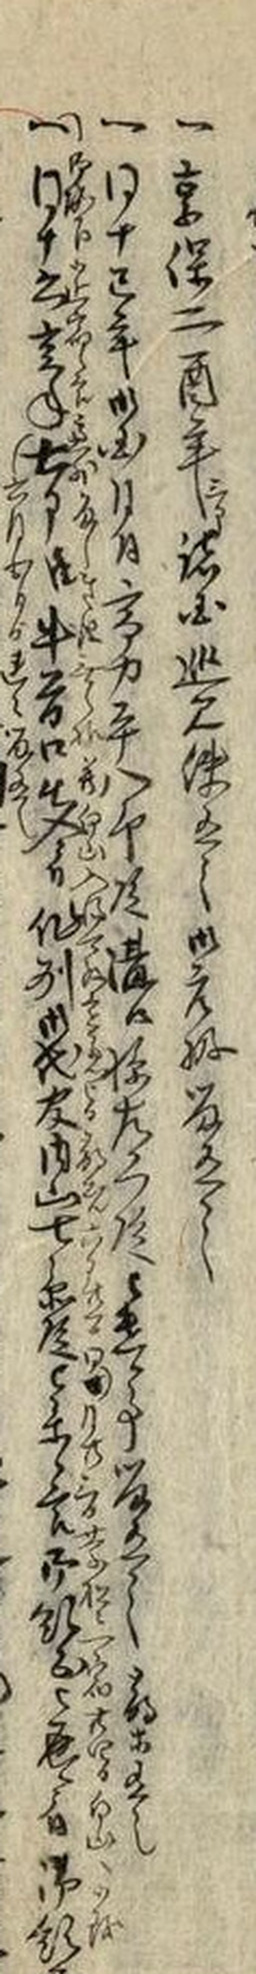一同十巳年御国目付高力平八郎殿溝口孫左衛門殿被遣候事留有之御触等有之
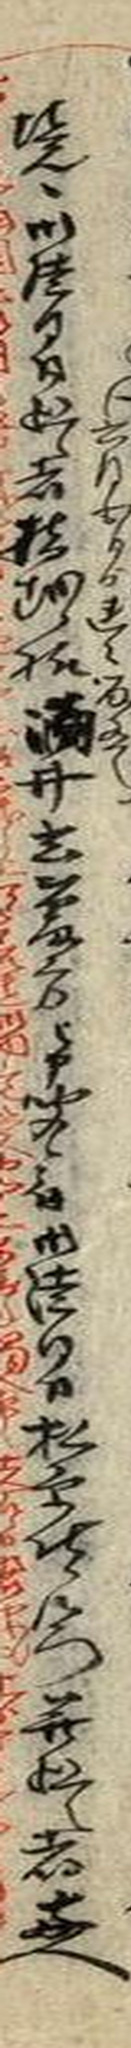境へ御徒目付組之者指越候様酒井玄蕃方被申聞候ニ付御徒目付松原次郎左衛門幷組之者両人
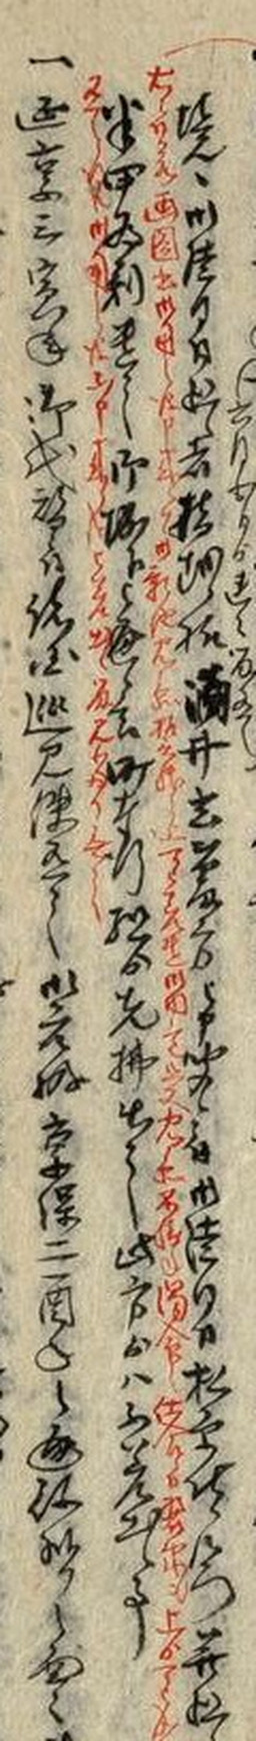半甲為剃遣之御城下被通候節町奉行組ゟ先払出之此方ゟハ不差出候事
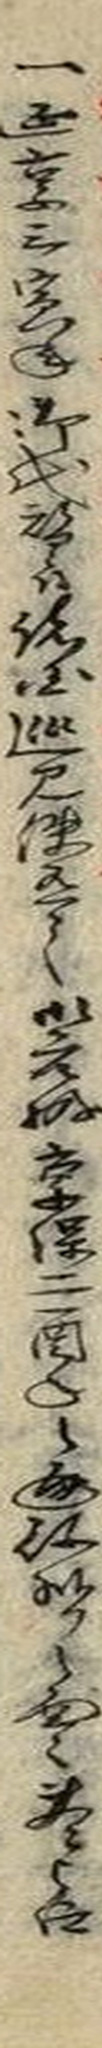一延享三寅年御代替ニ付諸国巡見使有之御取扱享保二酉年之通役掛り之面々夫々被仰
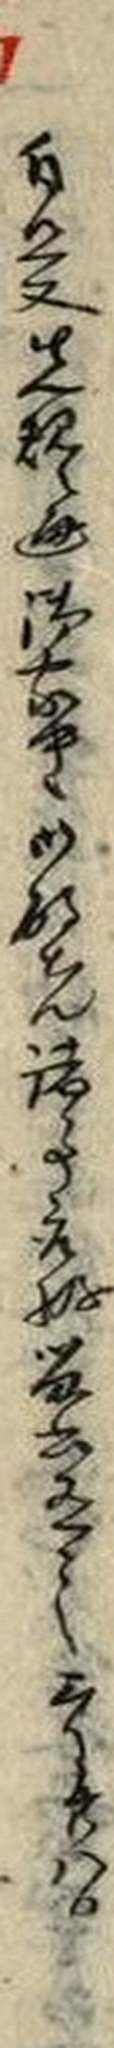付且又先規之通御家中へ御触出ル諸事取扱留書有之三月廿八日

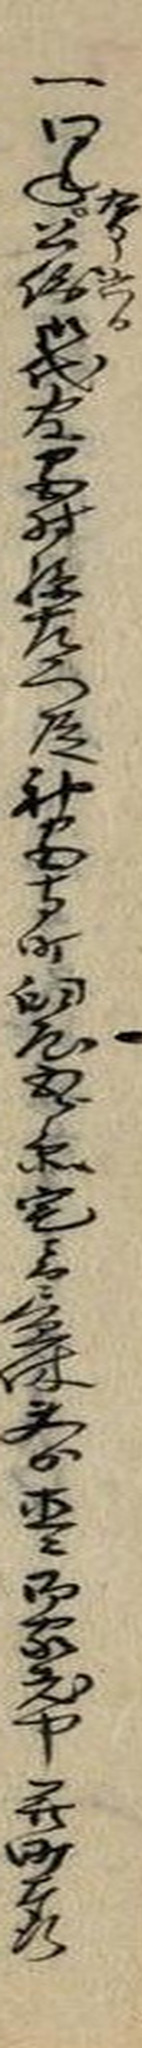一同年九月六日公儀御代官宮村孫左衛門殿神宮寺町臼屋五郎兵衛宅ニ而昼休夫ゟ直ニ御家老中幷町奉行
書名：御国他国諸事之部
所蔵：福井県文書館 Fukui Prefectural Archives
